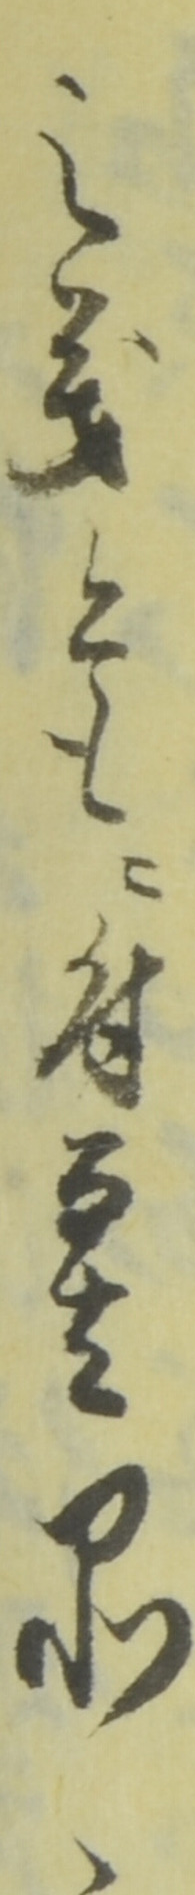之義ともニ付而は品々

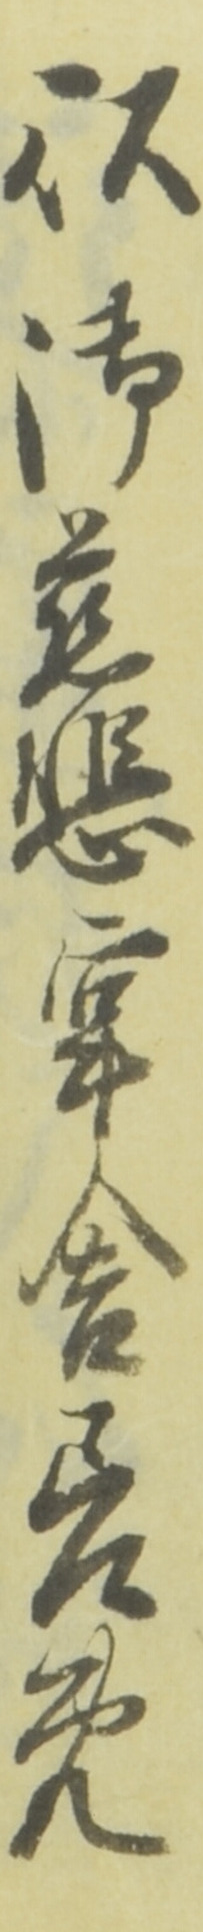以御慈悲窂舎差免
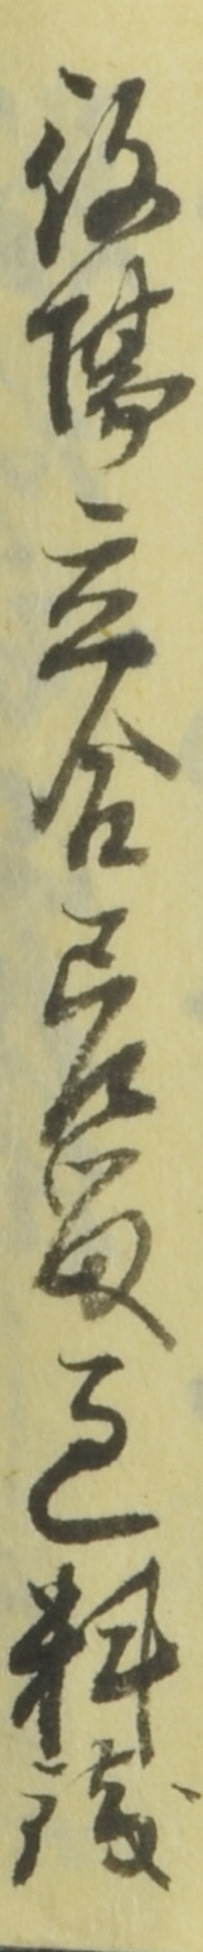役場立合差留過料銭
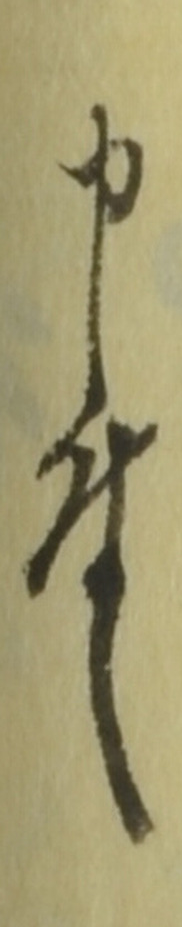申付候
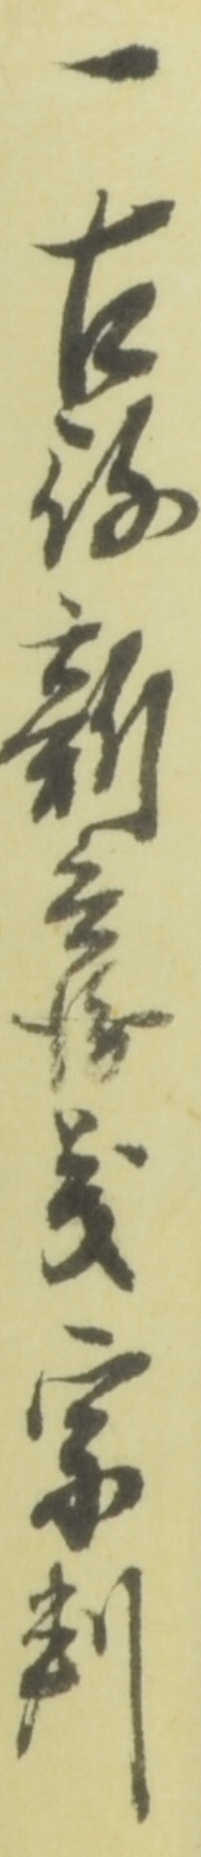一古役新兵衛義宗判
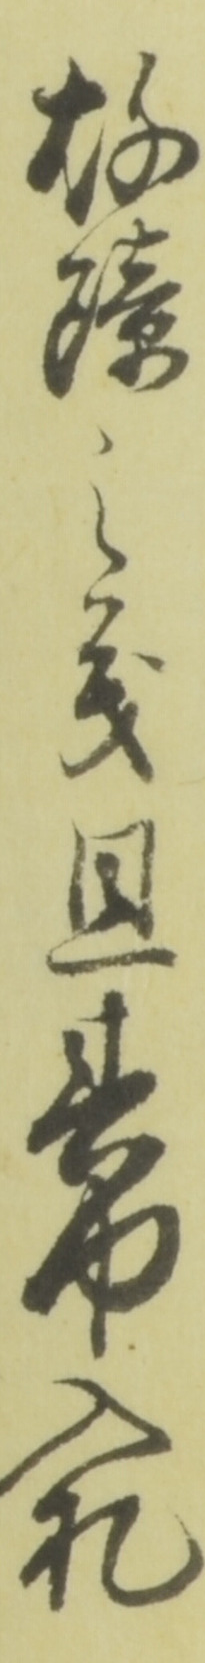故障之義且其中入札
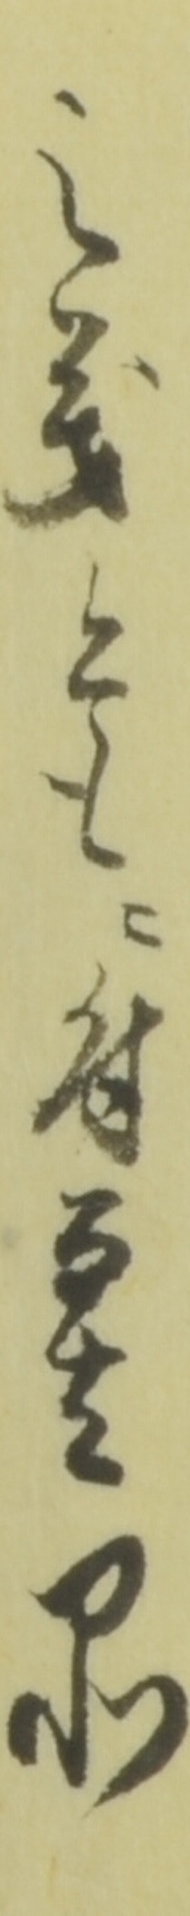之義ともニ付而は品々
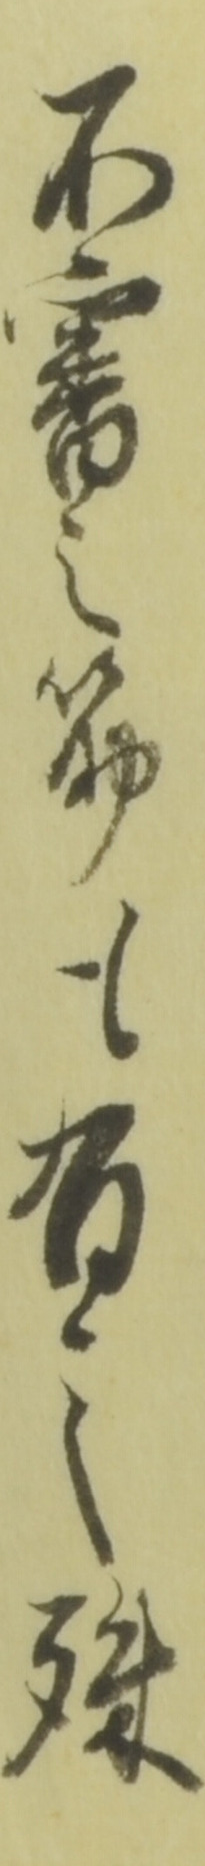不審之筋も有之殊
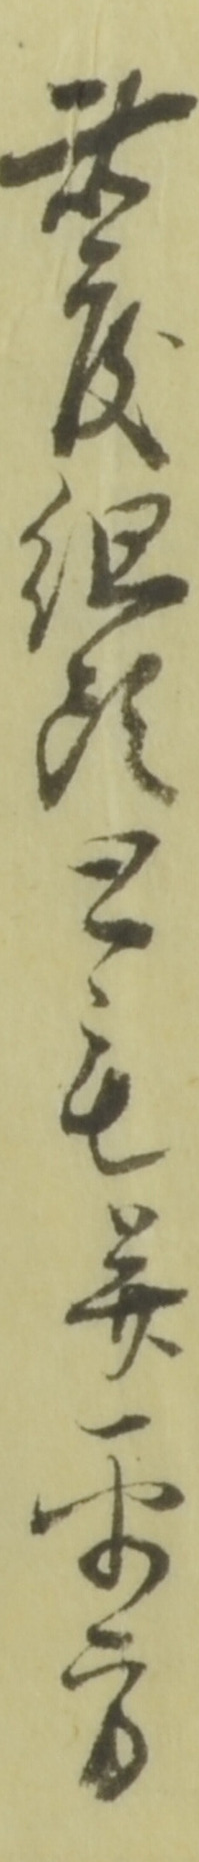此度組頭とも并平方
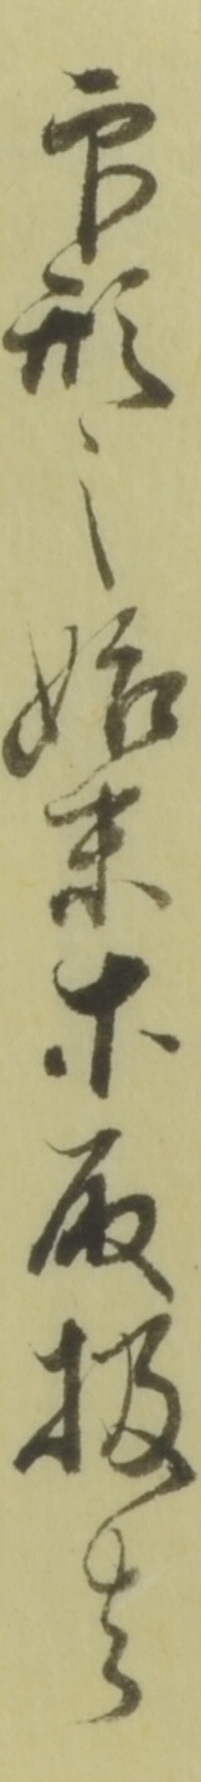印形之始末等取扱は
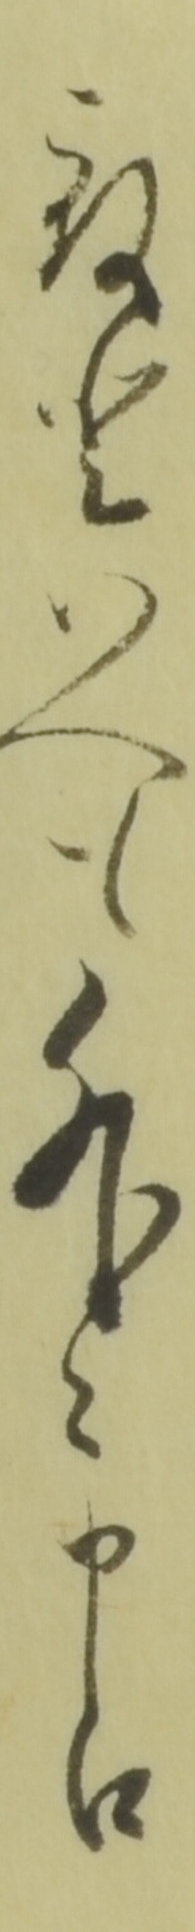致といへとも外ニ申
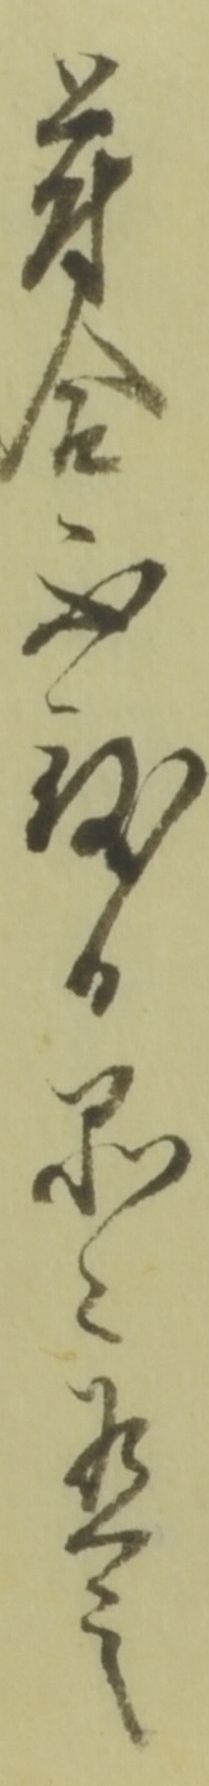符金不致候品々有之
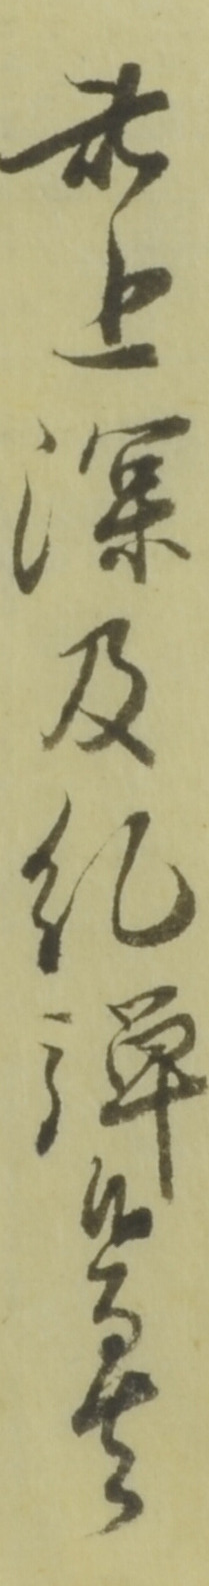此上深及糺弾候而は
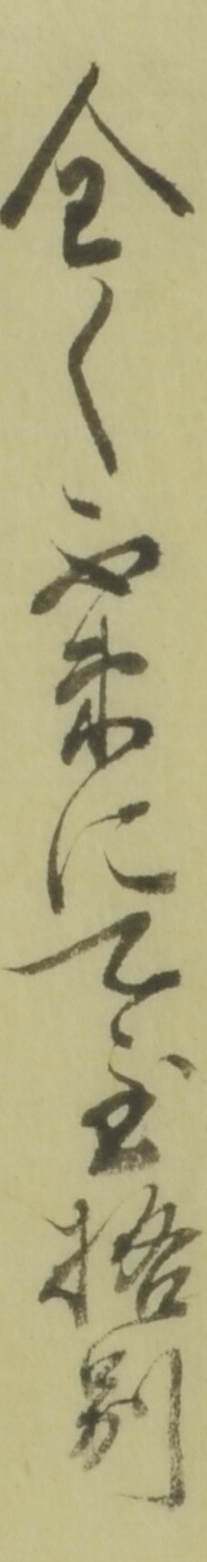全く不束にて可至格別
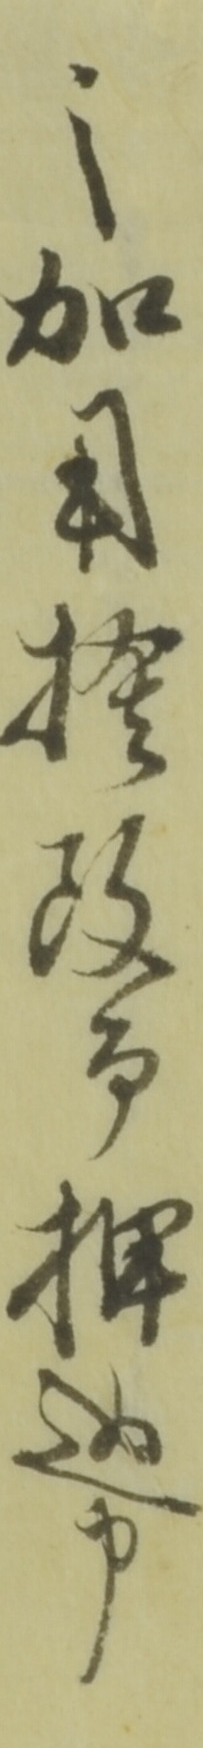之加用捨改而押込申
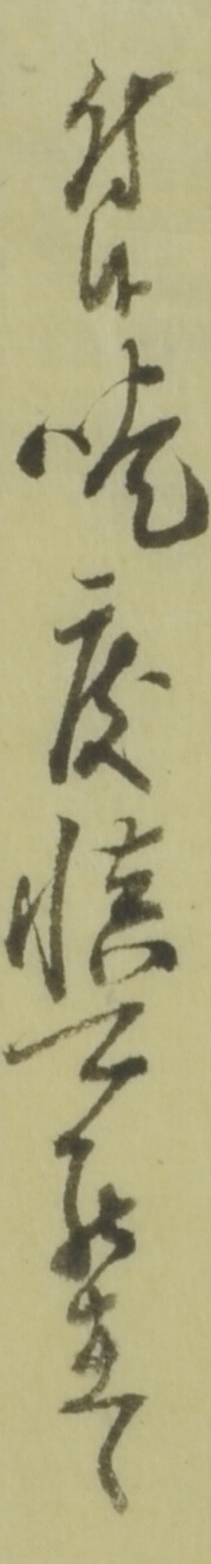付候屹度慎可罷在候
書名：御触書御書附控
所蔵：伊那市立高遠町図書館・合同会社AMANE
